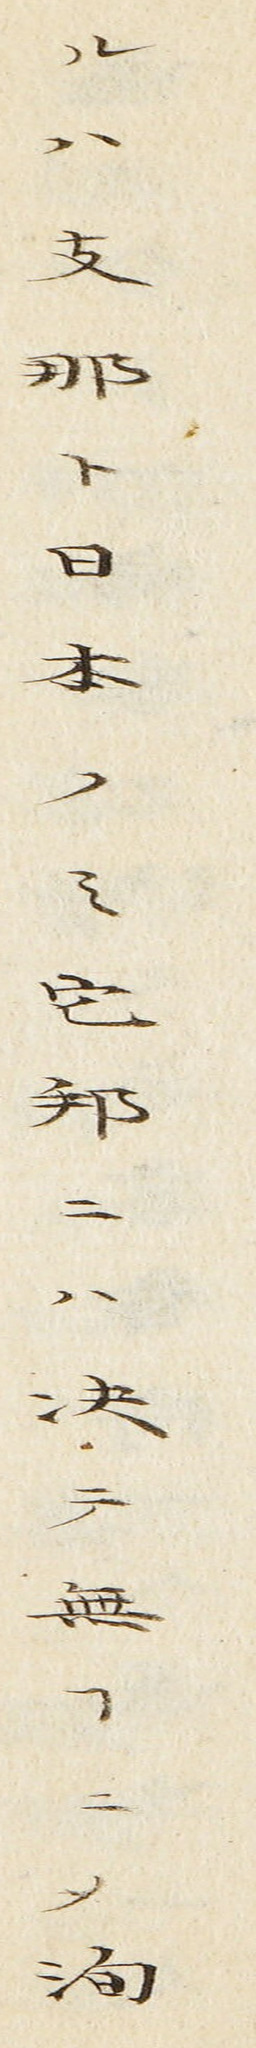ルハ支那ト日本ノミ它邦ニハ決テ無コトニシテ洵
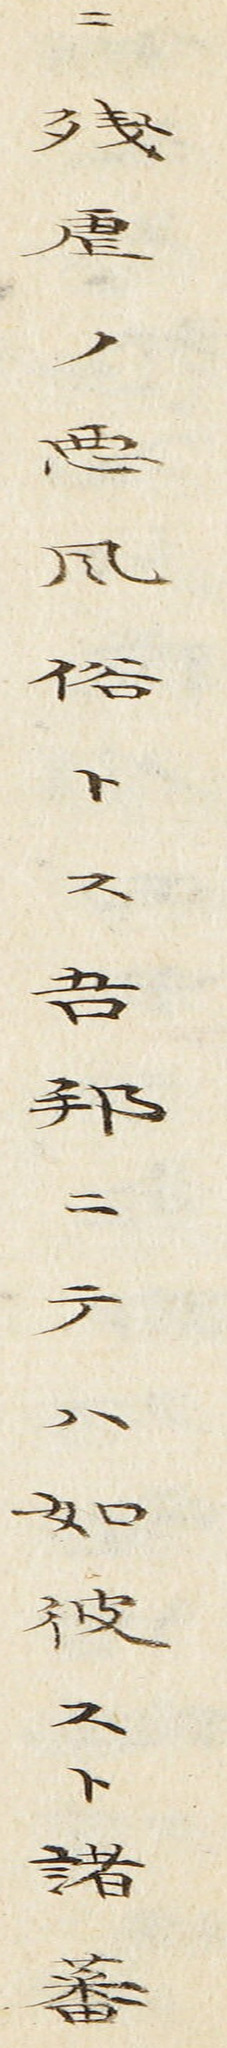ニ残虐ノ悪風俗トス吾邦ニテハ如彼スト諸蕃
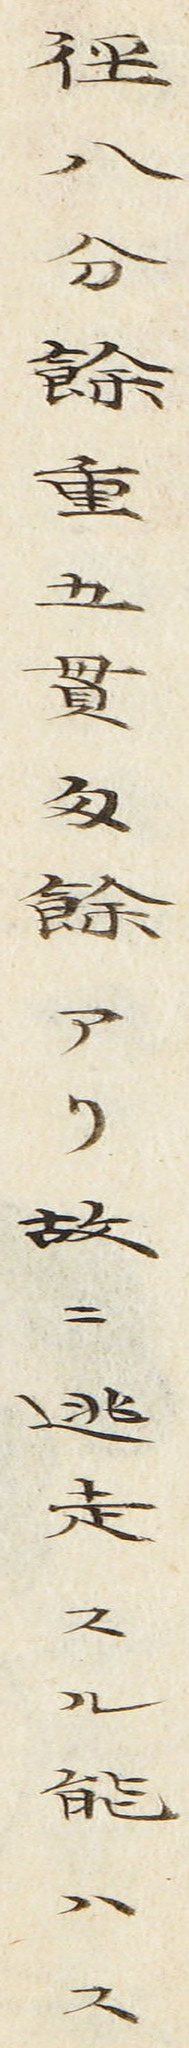径八分余重五貫匁余アリ故ニ逃走スル能ハス
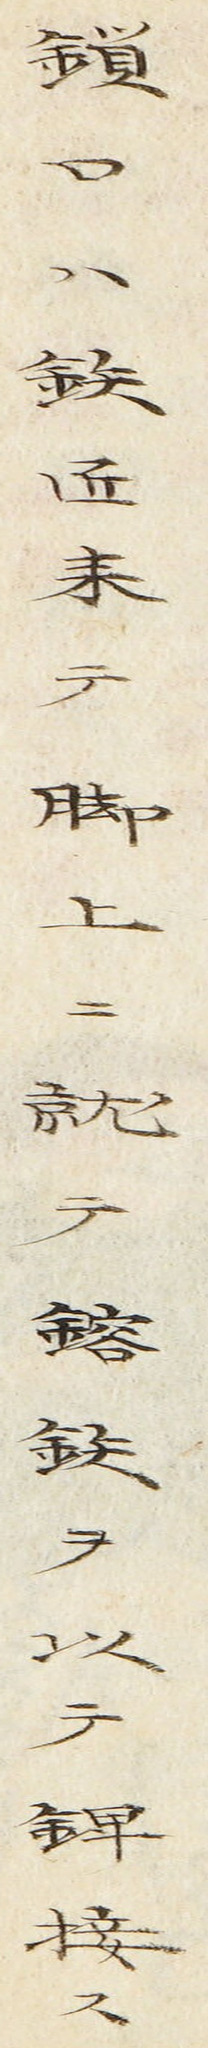鎖口ハ鉄匠来テ脚上ニ就テ鎔鉄ヲ以テ銲接ス
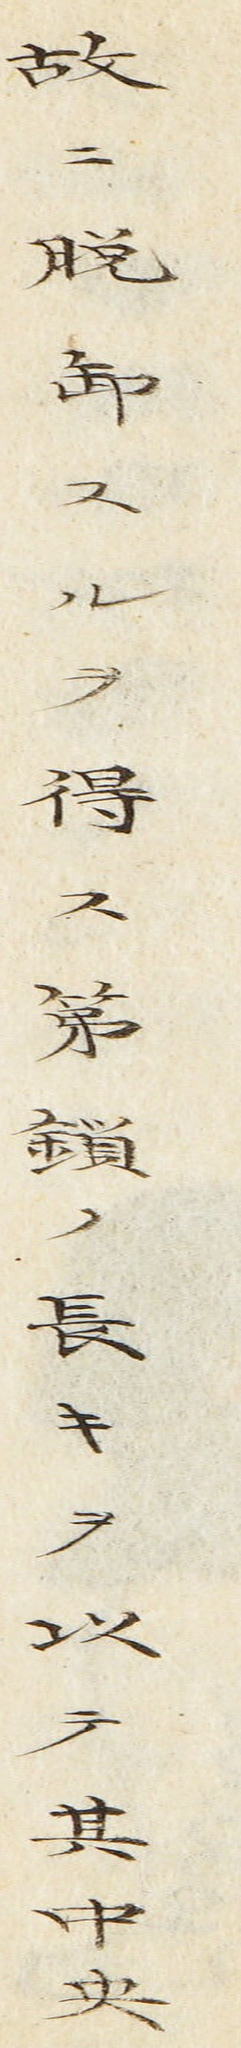故ニ脱卸スルヲ得ス第鎖ノ長キヲ以テ其中央
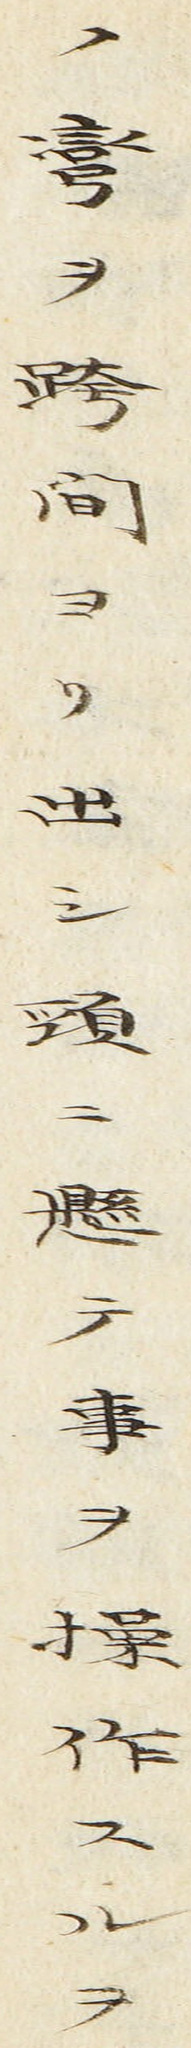ノ彎ヲ跨間ヨリ出シ頸ニ懸テ事ヲ操作スルヲ
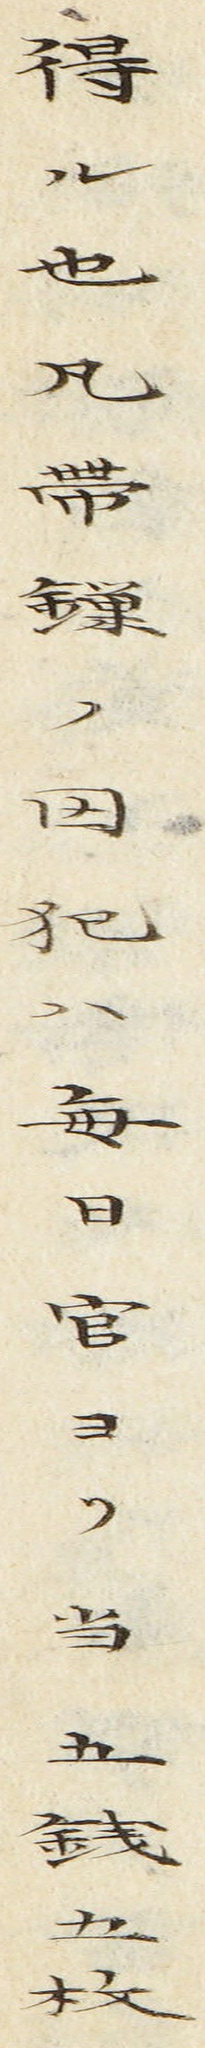得ル也凡帯鏁ノ囚犯ハ毎日官ヨリ当五銭五枚

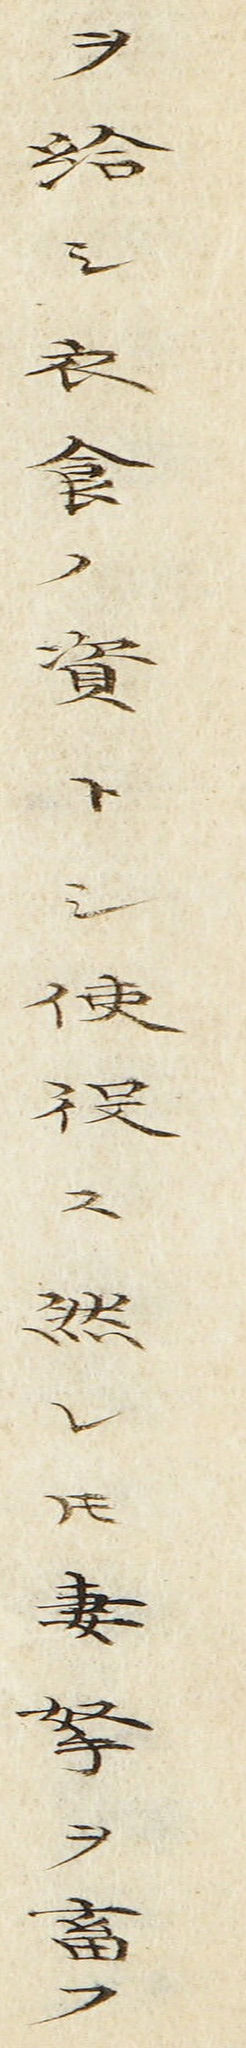ヲ給シ衣食ノ資トシ使役ス然レトモ妻拏ヲ畜フ
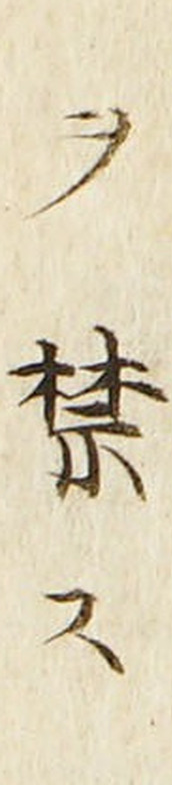ヲ禁ス
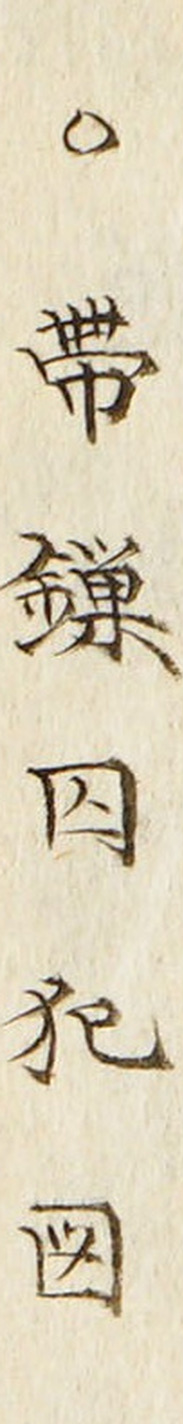〇帯鏁囚犯図
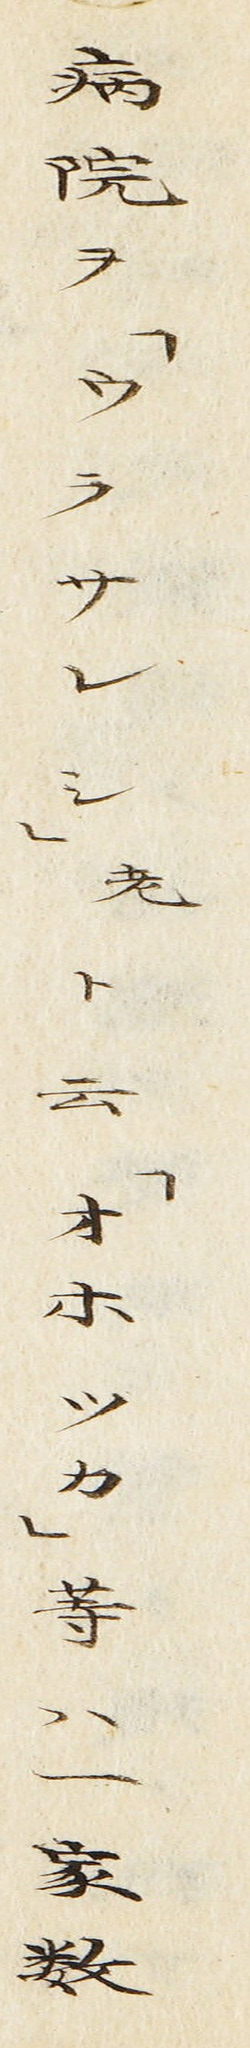〇病院ヲ「ウラサレシ」老ト云「オホツカ」等ハ一家数
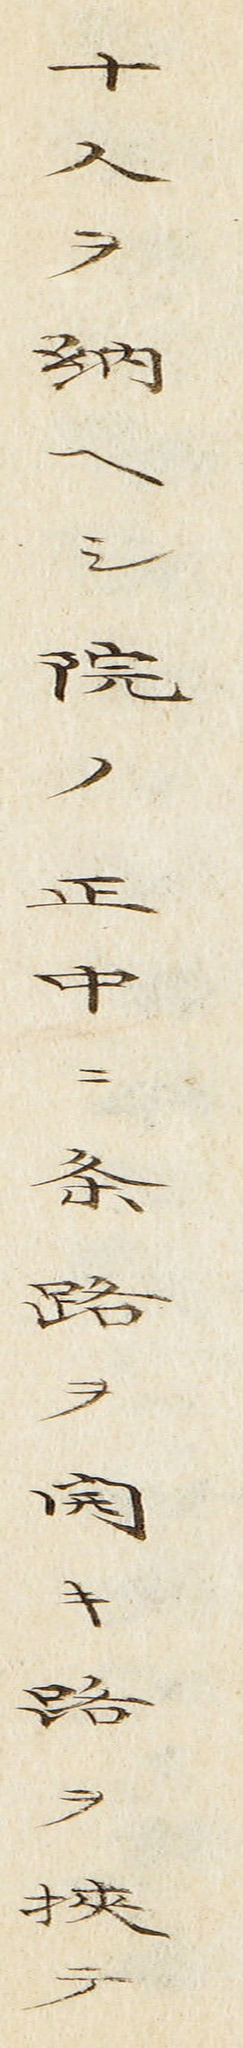十人ヲ納ヘシ院ノ正中ニ条路ヲ開キ路ヲ挟テ
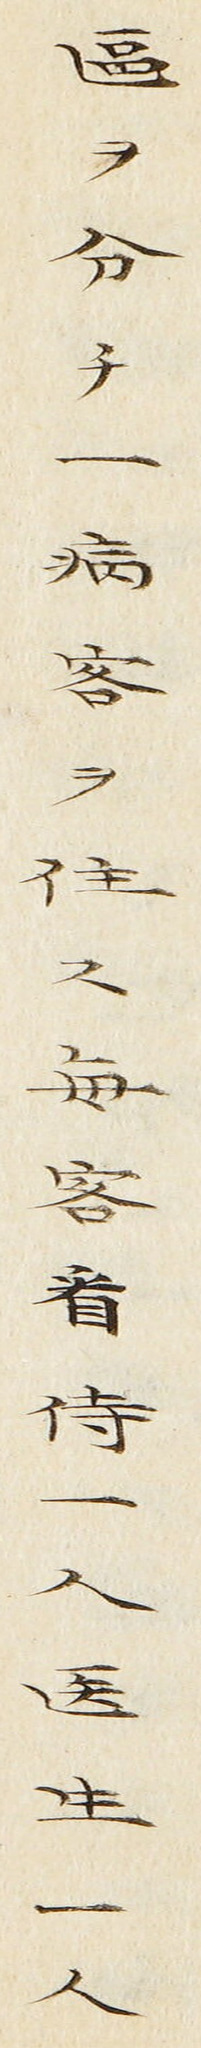区を分チ一病客ヲ住ス毎客看侍一人医生一人
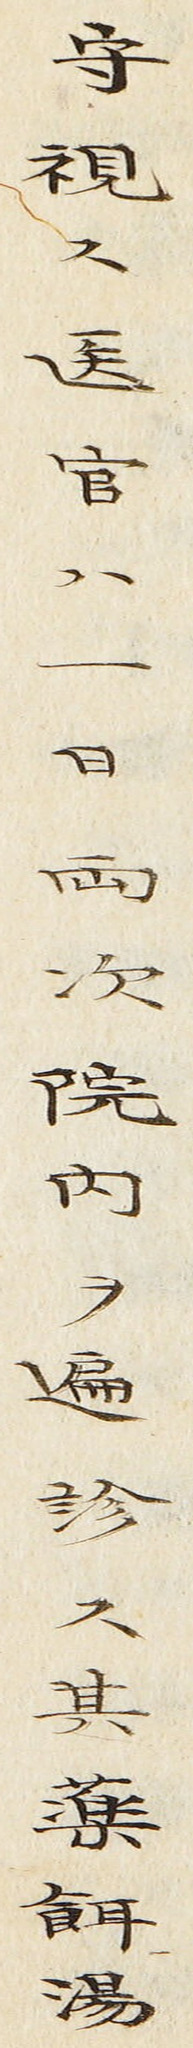守視ス医官ハ一日両次院内ヲ遍診ス其薬餌湯
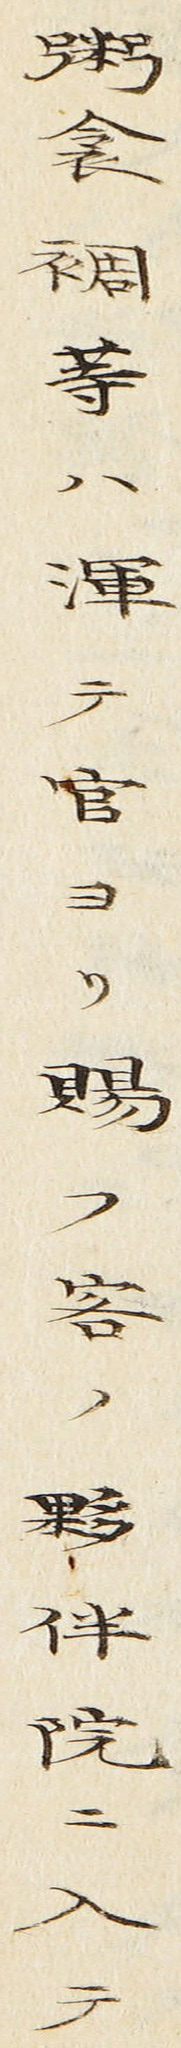粥ふ衾裯等ハ渾テ官ヨリ賜フ客ノ夥伴院ニ入テ
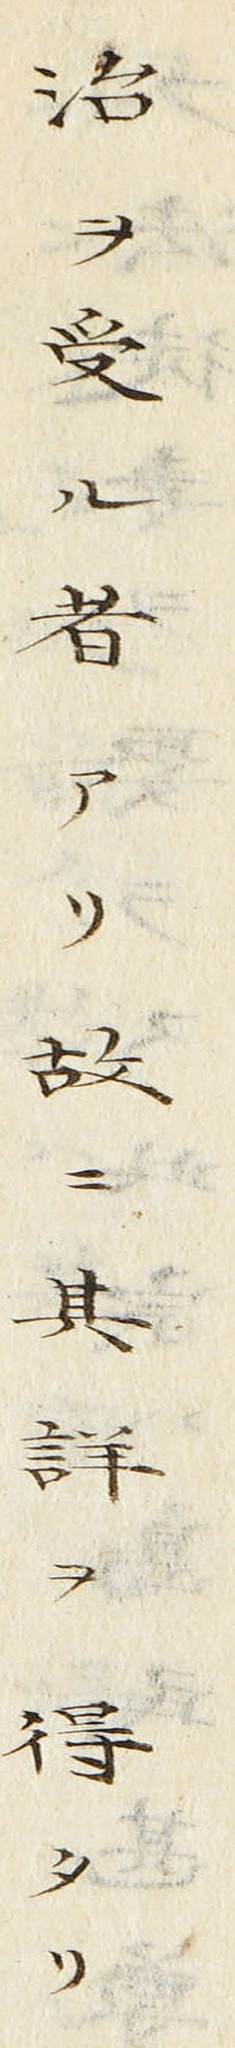治ヲ受ル者アリ故ニ其詳ヲ得タリ
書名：蕃談
